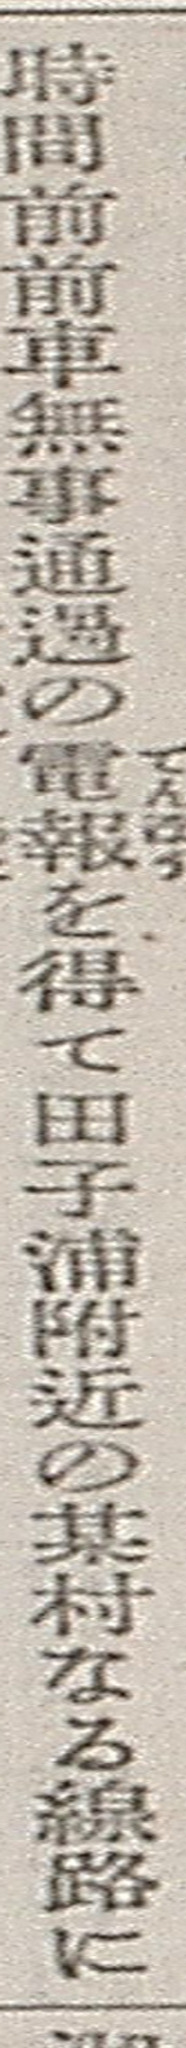時間前前車無事通過の電報を得て田子浦附近の某村なる線路に
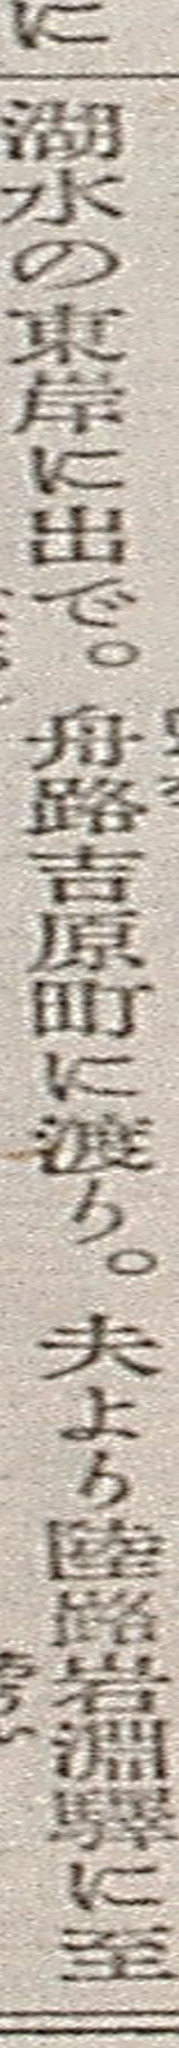湖水の東岸に出で。舟路吉原町に渡り。夫より陸路岩淵駅に至
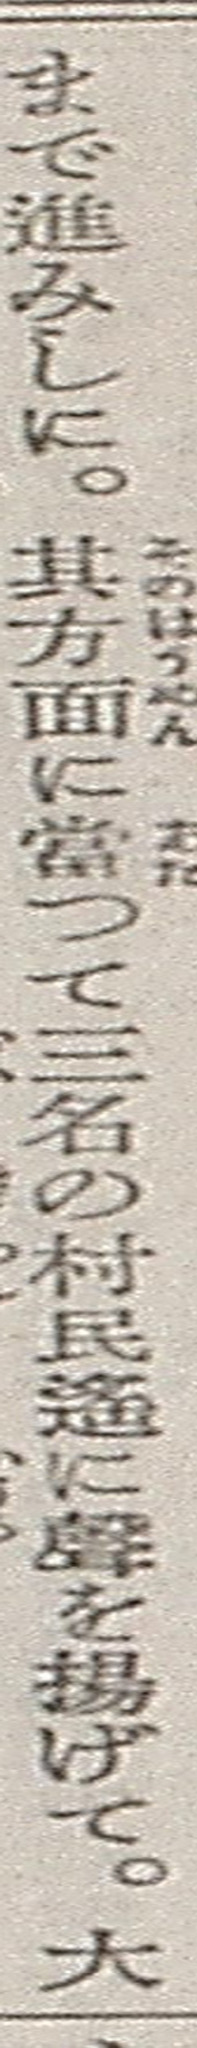まで進みしに。其方面に当つて三名の村民遥に声を揚げて。大
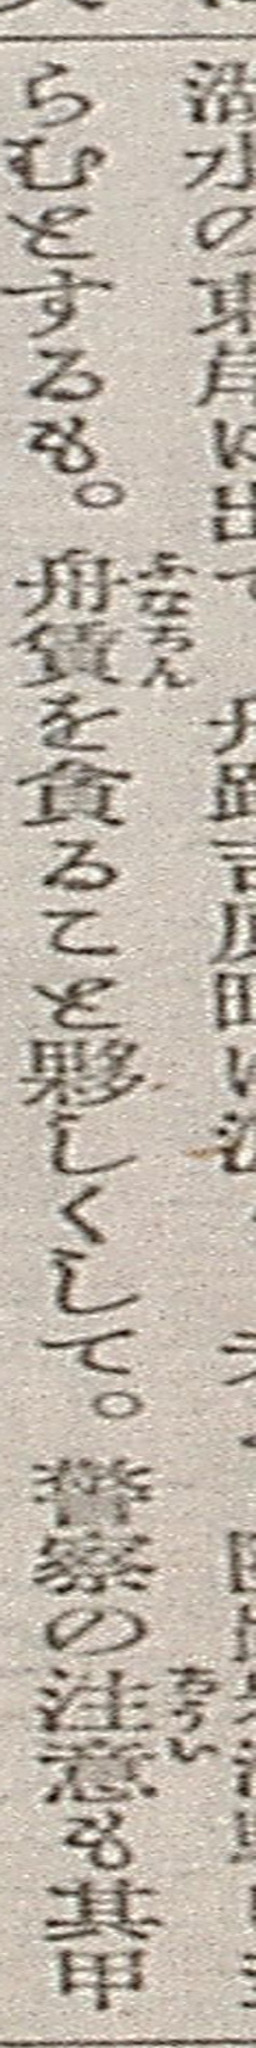らむとするも。舟賃を貧ること夥しくして。警察の注意も其甲
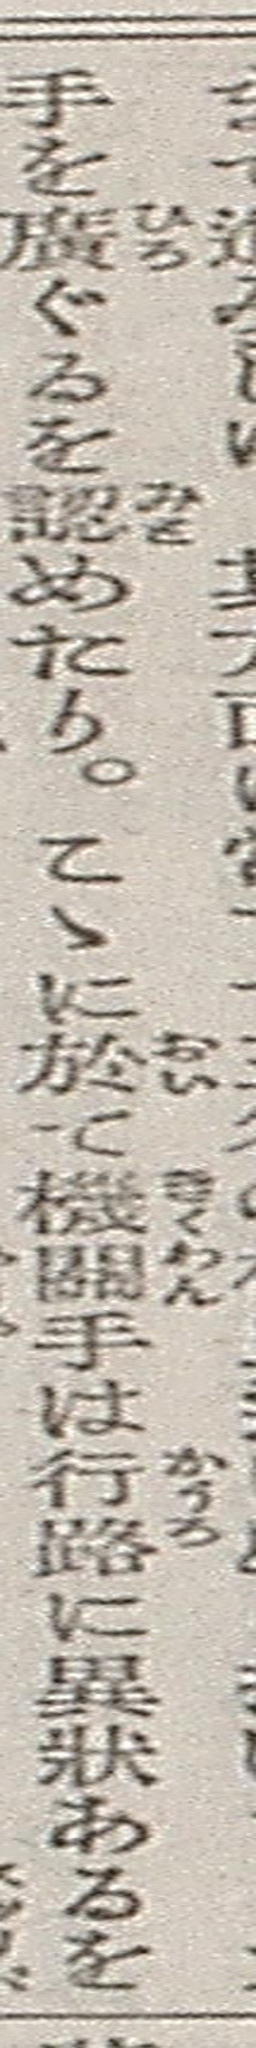手を広ぐるを認めたり。こゝに於て機関手は行路に異状あるを
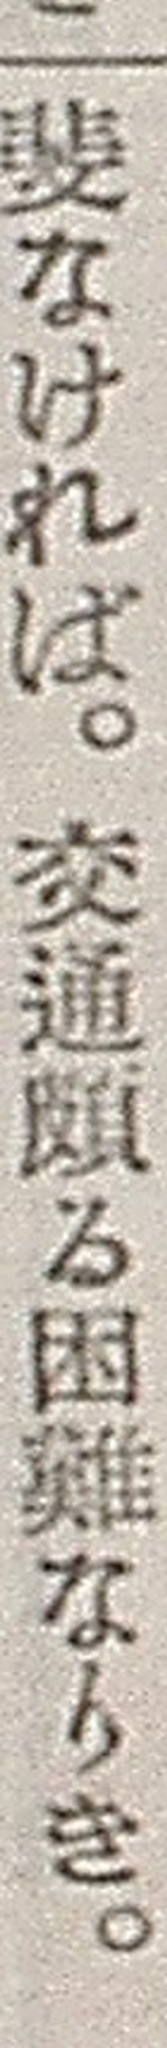斐なければ。交通頗る困難なりき。
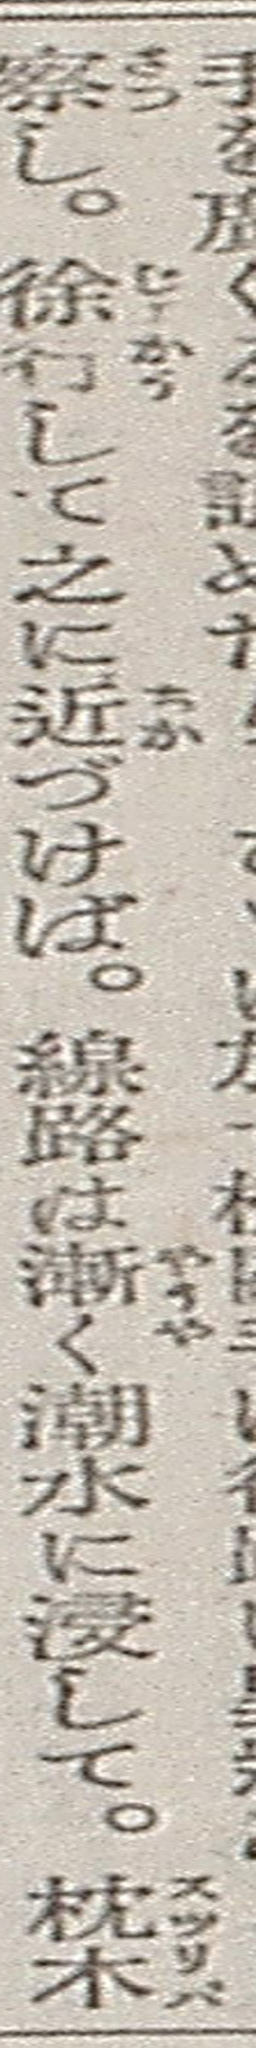察し。徐行して之に近づけば。線路は漸く潮水に浸して。枕木
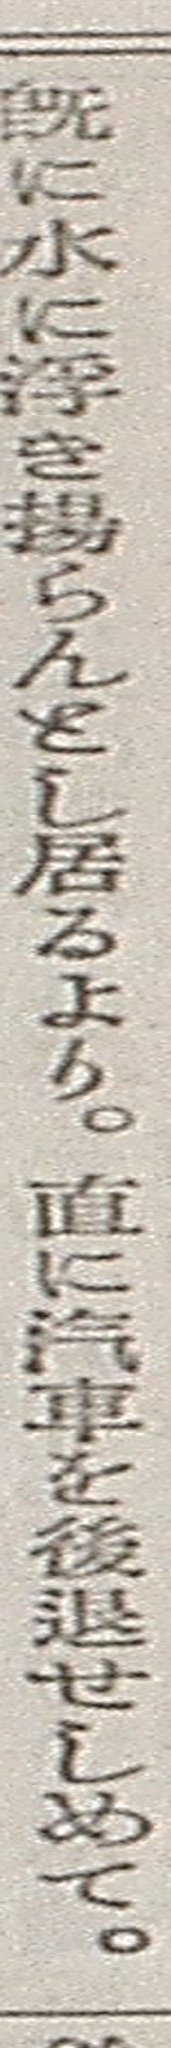既に水に浮き揚らんとし居るより。直に汽車を後退せしめて。
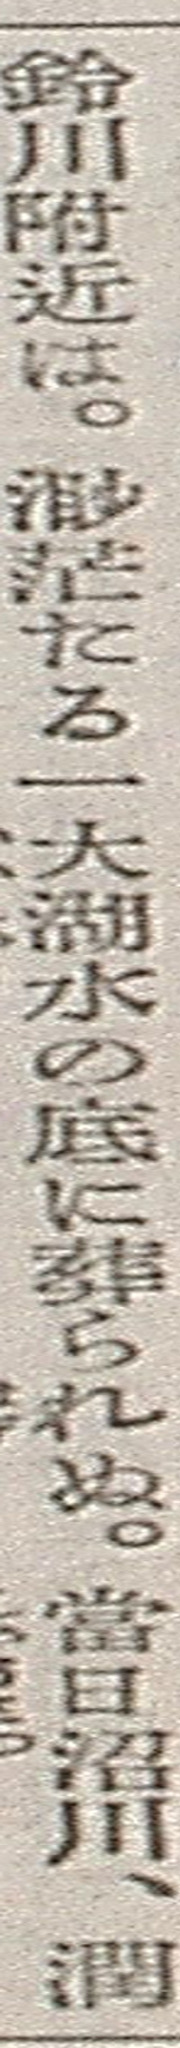鈴川附近は。渺茫たる一大湖水の底に葬られぬ。当日沼川、潤
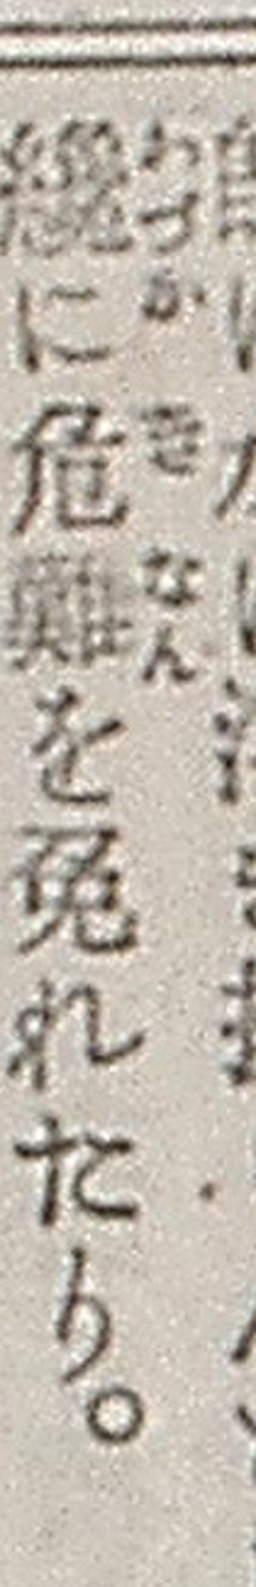纔に危難を免れたり。
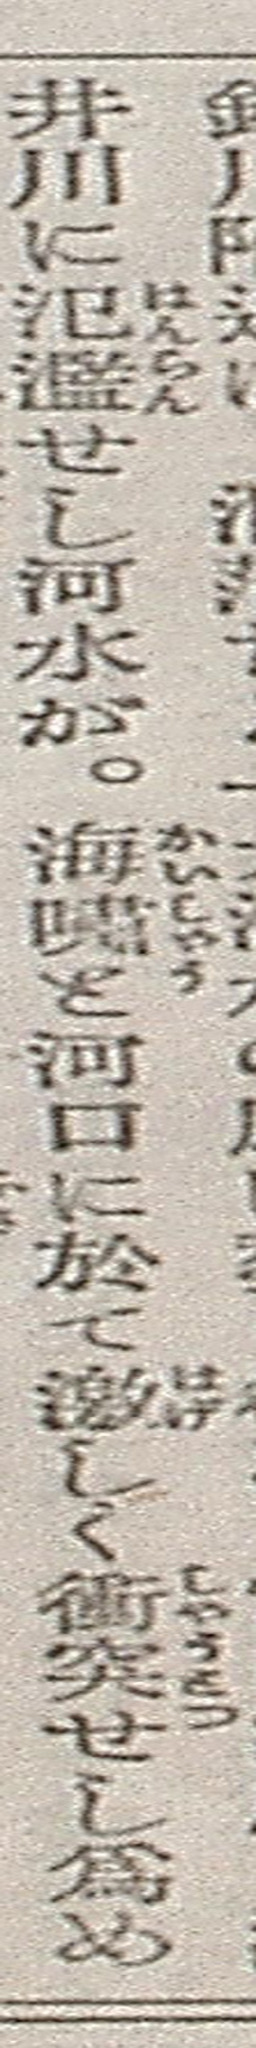井川に氾濫せし河水が。海嘯と河口に於て激しく衝突せし為め
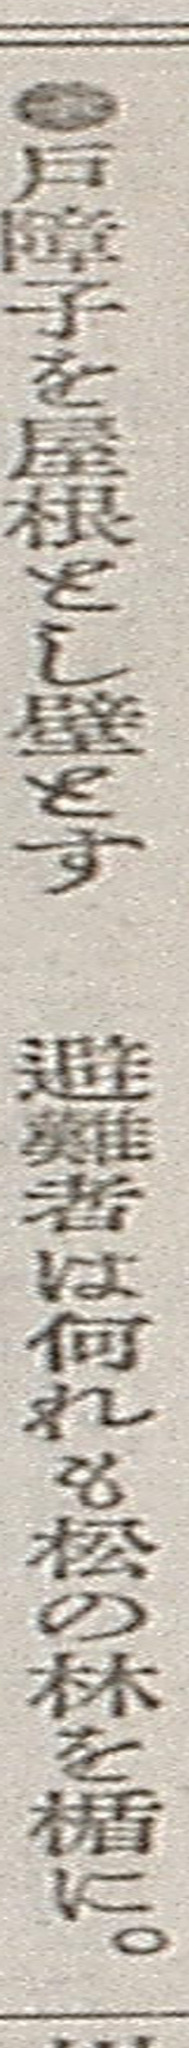●戸障子を屋根とし壁とす避難者は何れも松の林を楯に。
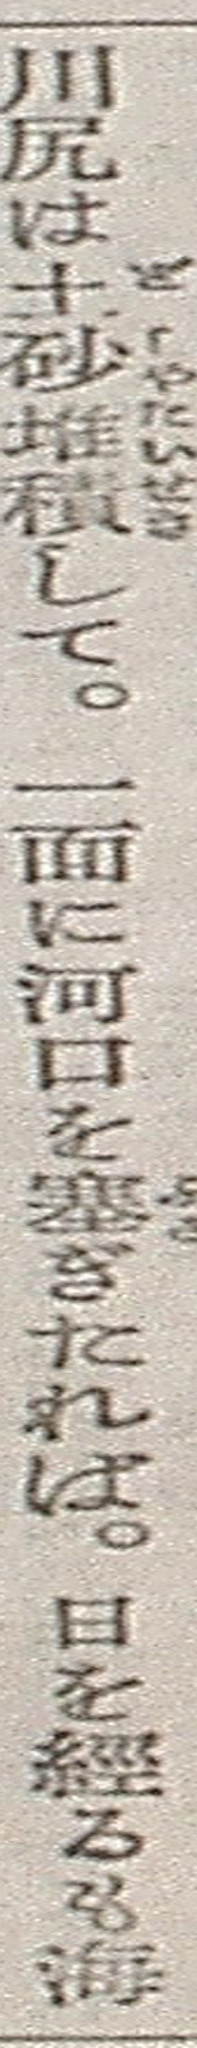川尻は土砂堆積して。一面に河口を塞ぎたれば。日を経るも海
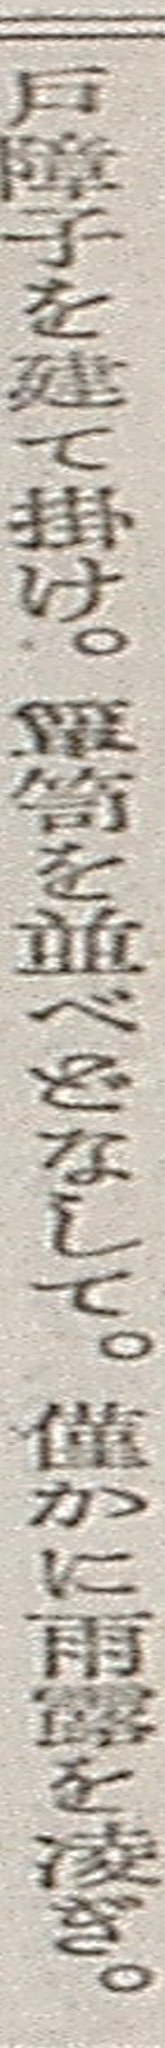戸障子を建て掛け。箪笥を並べとなして。僅かに雨露を凌ぎ。
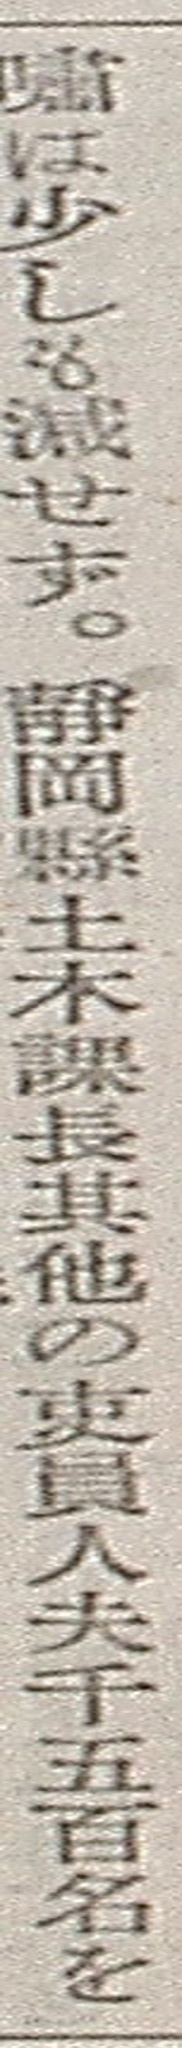嘯は少しも減せず。静岡県土木課長其他の吏員人夫千五百名を
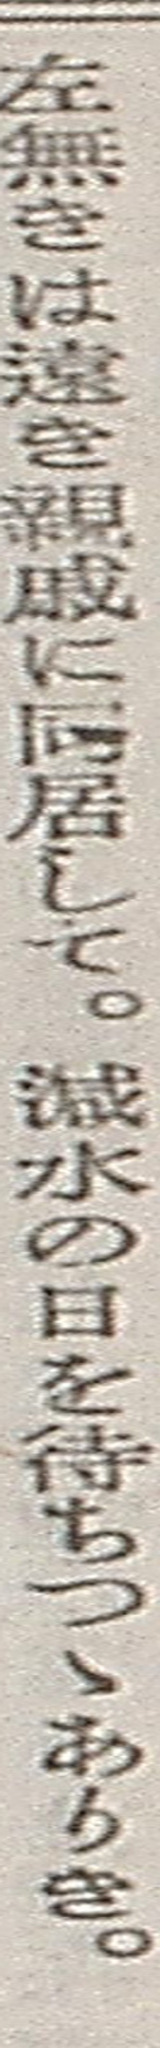左無きは遠き親戚に同居して。減水の日を待ちつゝありき。
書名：風俗畫報臨時増刊第百九十九號　明治三十二年十月各地災害圖會（前編之續）
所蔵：東京大学地震研究所図書室 Earthquake Research Institute Library, The University of Tokyo, JAPAN
